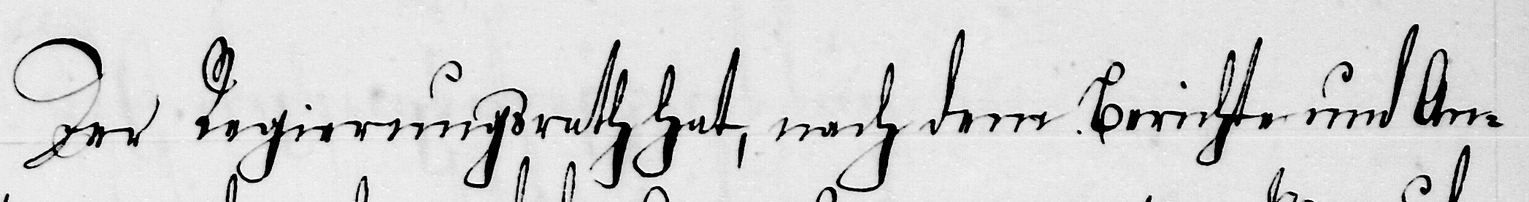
Der Regierungsrath hat, nach dem Berichte und An¬
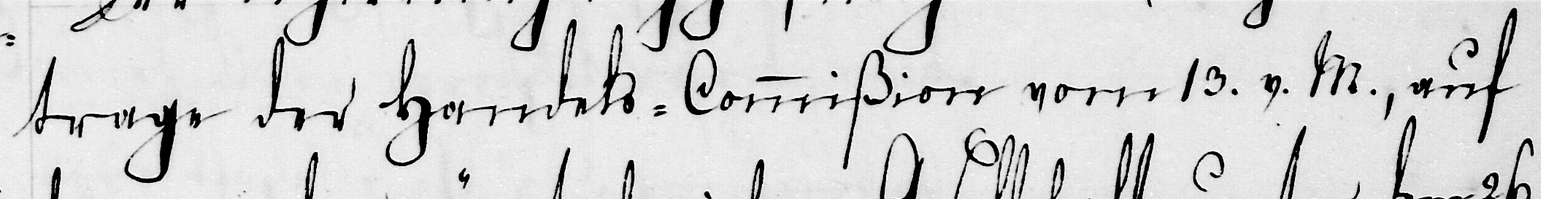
trage der Handels-Commißion vom 13. v. M., auf
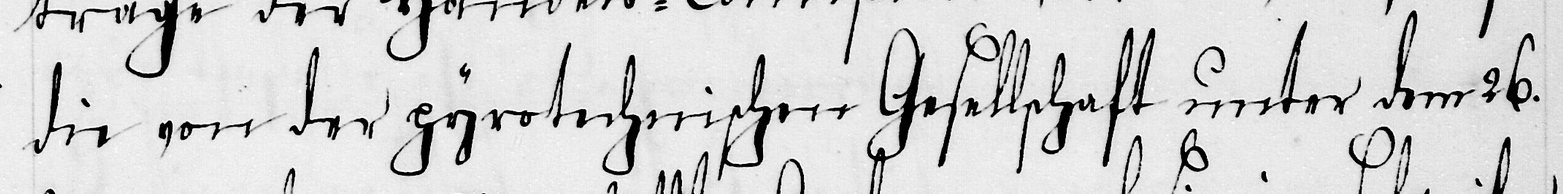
die von der pyrotechnischen Gesellschaft unter dem 26.
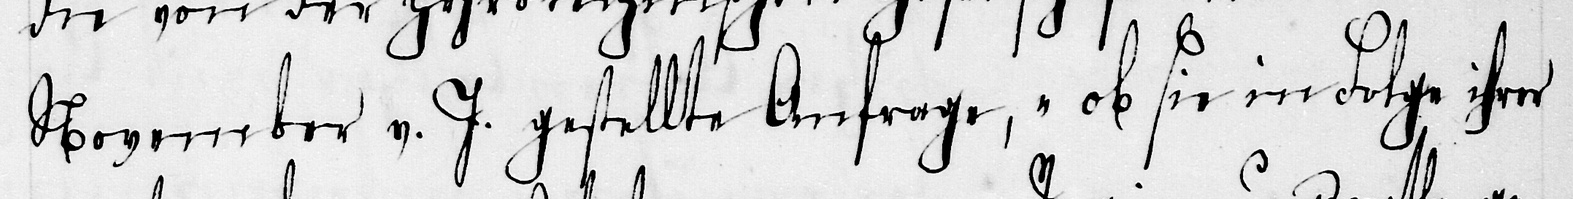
November v. J. gestellte Anfrage, „ob sie in Folge ihrer
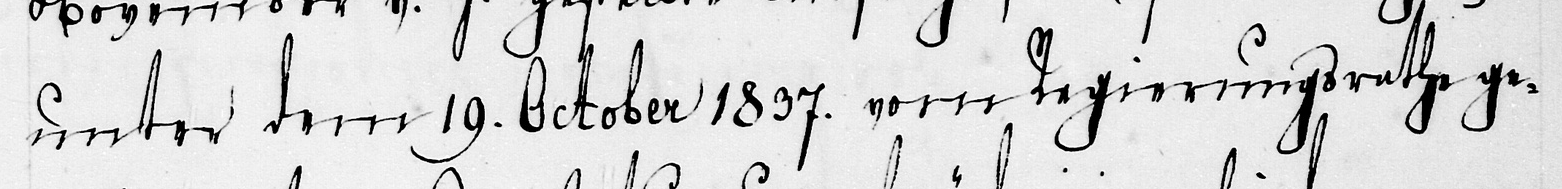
unter dem 19. October 1837 vom Regierungsrathe ge¬
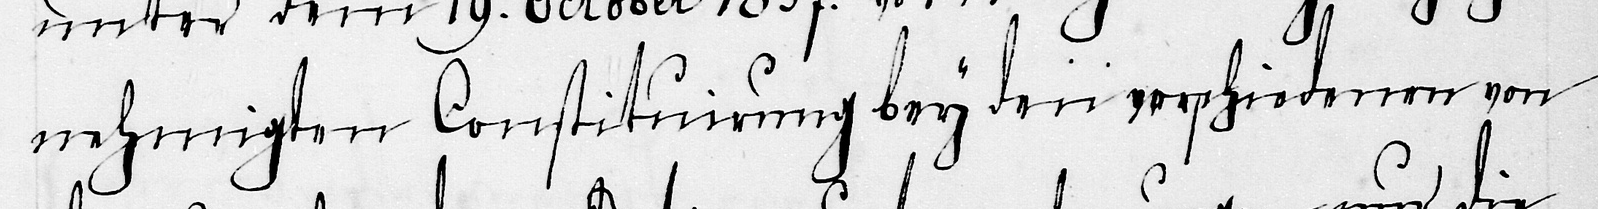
nehmigten Constituirung bey den verschiednenen von
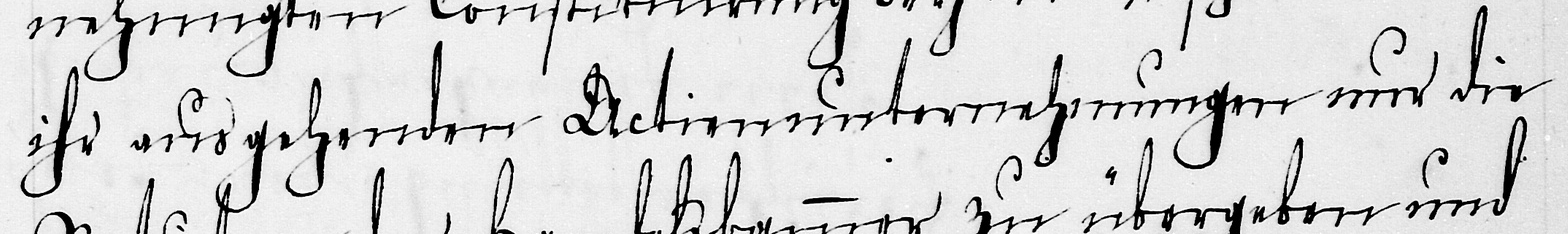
ihr ausgehenden Actienunternehmungen nur die
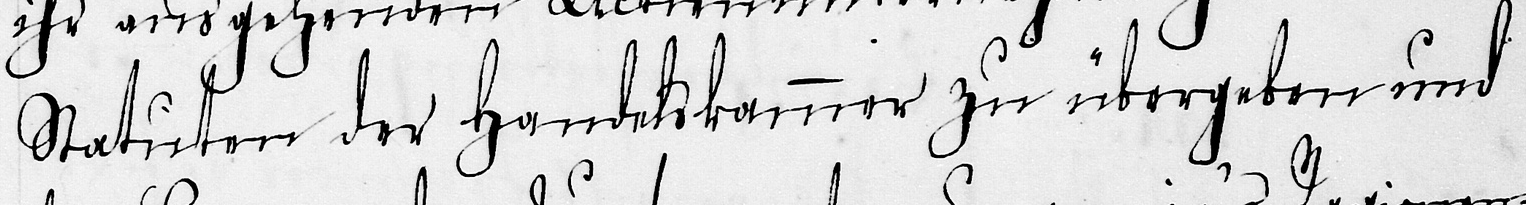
Statuten der Handelskammer zu übergeben und
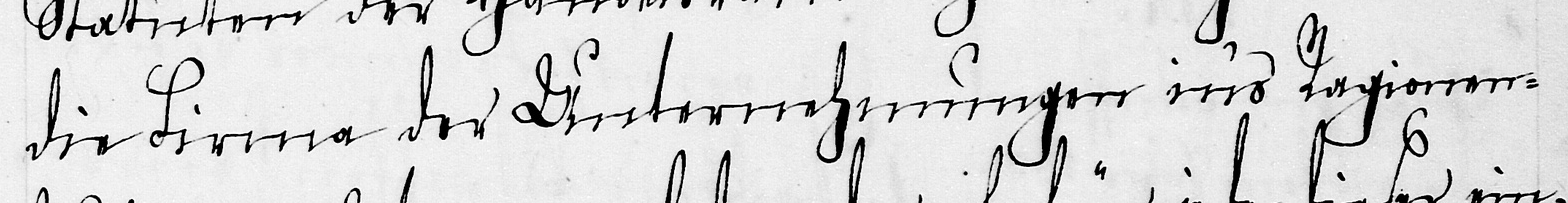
die Firma der Unternehmungen in‘s Ragionen¬
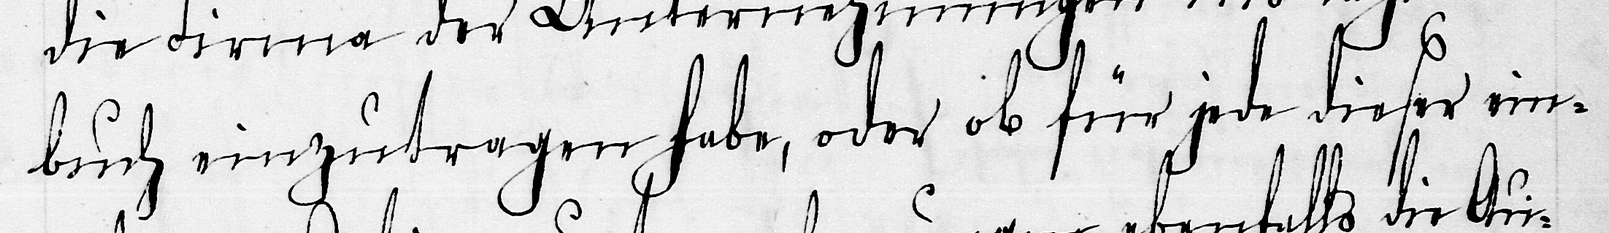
buch einzutragen habe, oder ob für jede dieser ein¬
